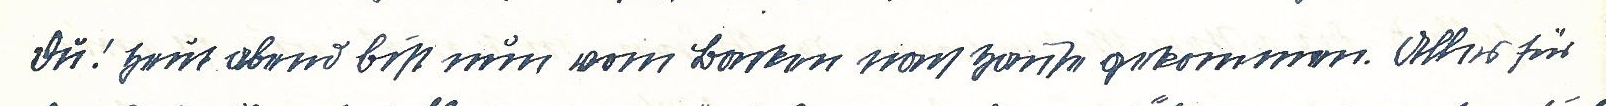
Du! Heut abend bist Du nun vom Backen nach Hause gekommen. Alles für
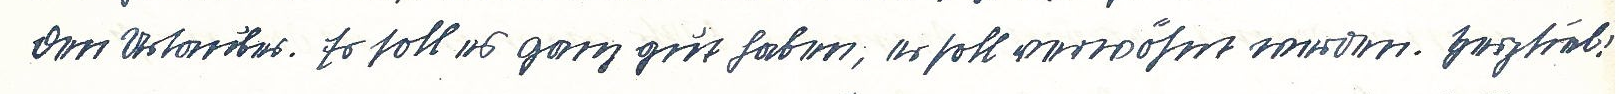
den Urlauber. Er soll es ganz gut haben, er soll verwöhnt werden. Herzlieb!
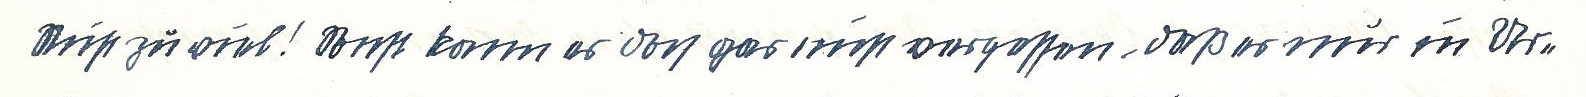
Nicht zu viel! Sonst kann er doch gar nicht vergessen, daß er nur im Ur¬
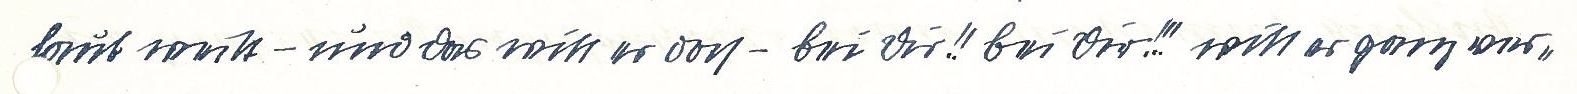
laub weilt – und das will er doch – bei Dir!! Bei Dir!!! will er ganz ver¬
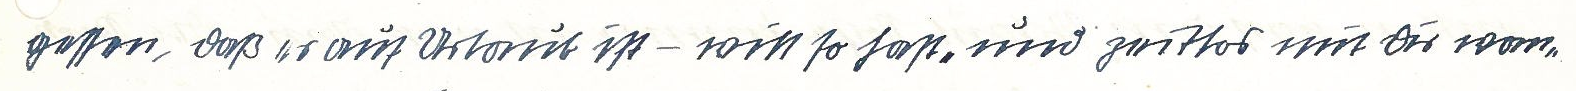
gessen, daß er auf Urlaub ist – will so hast- und zeitlos mit Dir wan¬
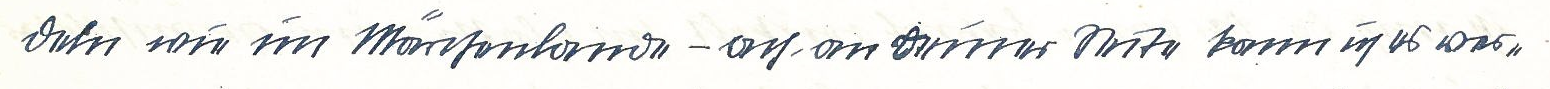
deln wie im Märchenlande – ach, an Deiner Seite kann ich es ver¬
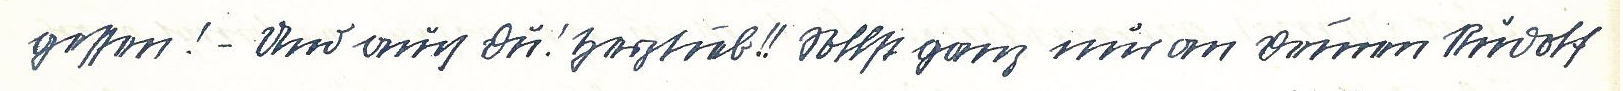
gessen! – und auch Du! Herzlieb!! Sollst ganz nur an Deinen Rudolf
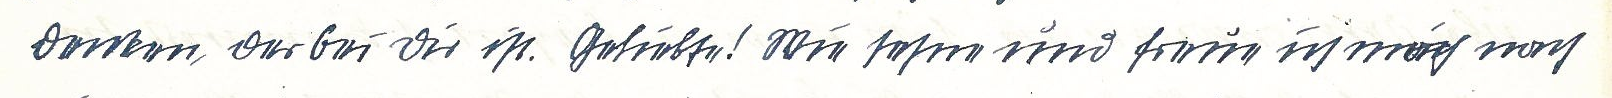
denken, der bei Dir ist. Geliebte! Wie sehne und freue ich mich nach
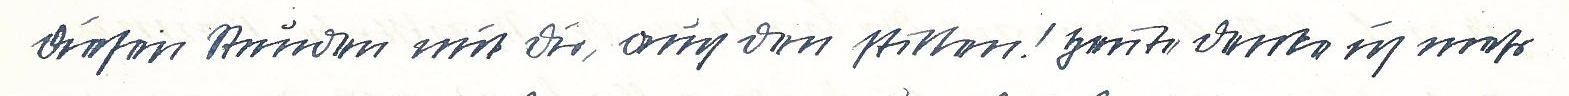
diesen Stunden mit Dir, auch den stillen! Heute denke ich mehr
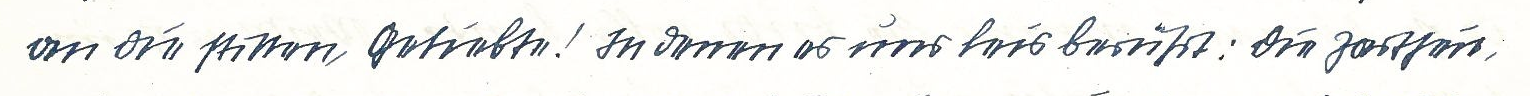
an die stillen, Geliebte! In denen es uns leis berührt: die Zartheit,
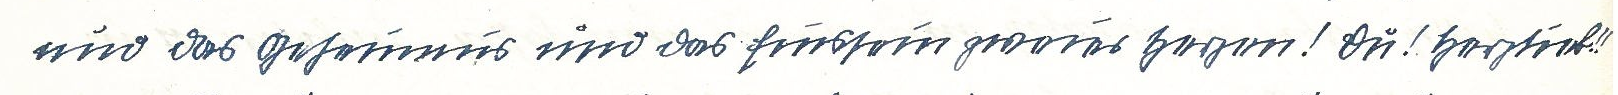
und das Geheimnis und das Einssein zweier Herzen! Du! Herzlieb!!
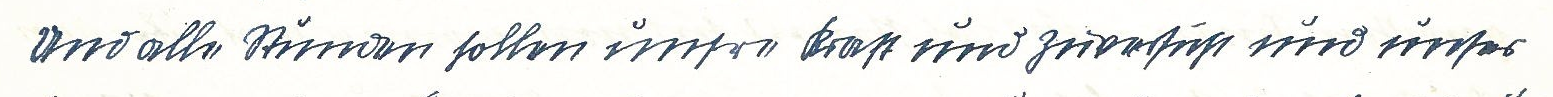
Und alle Stunden sollen unsre Kraft und Zuversicht und unser
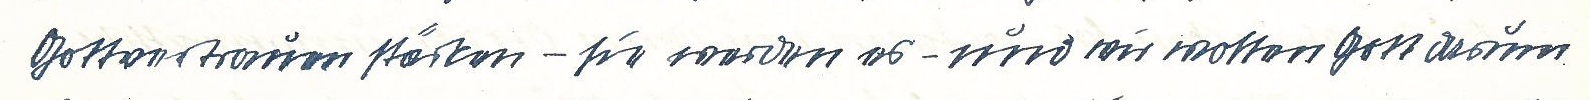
Gottvertrauen stärken – sie werden es – und wir wollen Gott darum
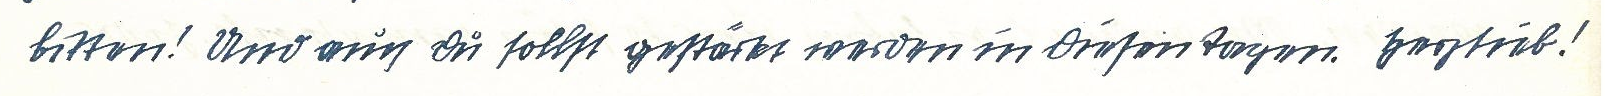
bitten! Und auch Du sollst gestärkt werden in diesen Tagen. Herzlieb!
